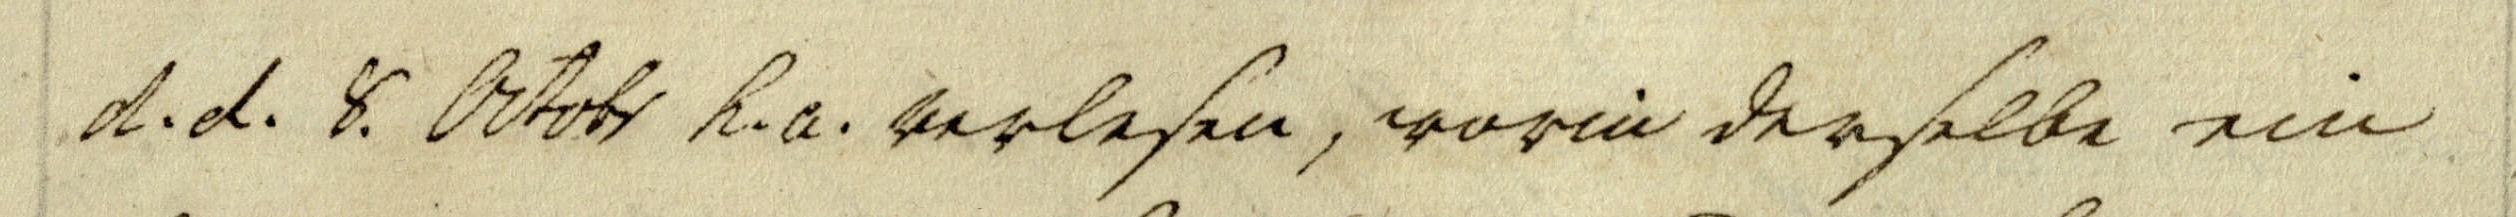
d. d. 8. Octobr h. a. verlesen, worin derselbe ein
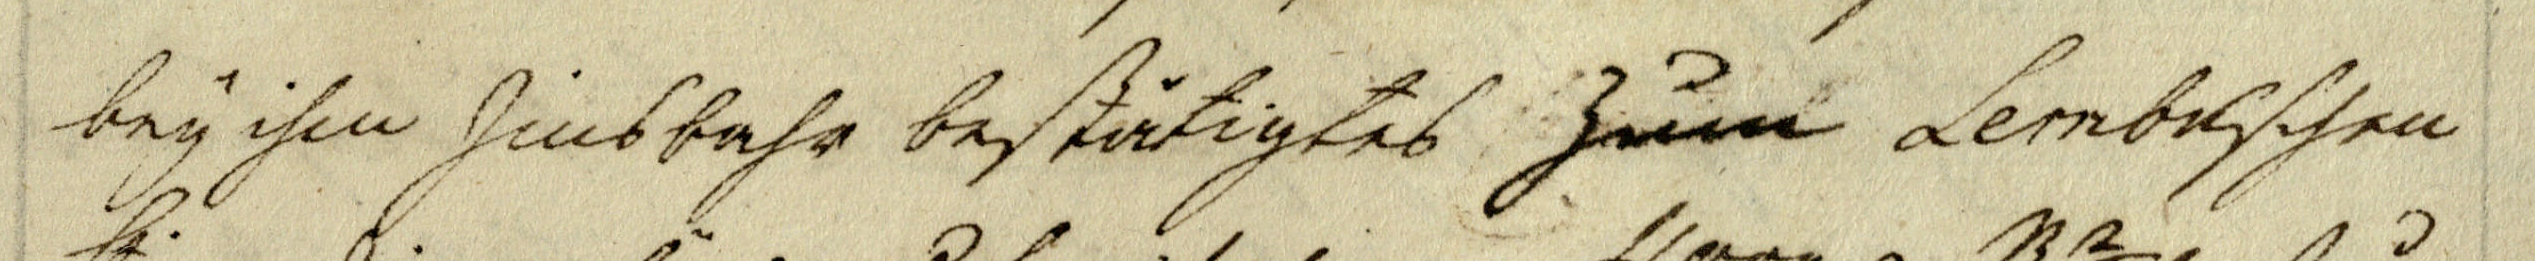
bei ihm zinsbahr bestätigtes zum Lembkschen
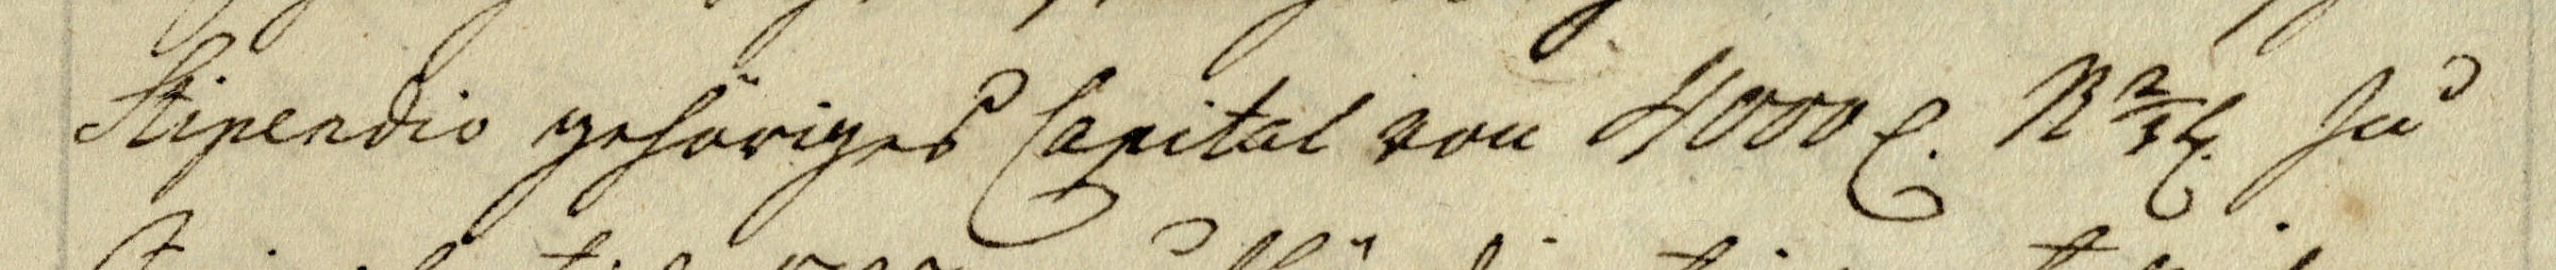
Stipendio gehöriges Capital von 4000 l. N ¾ s. zu
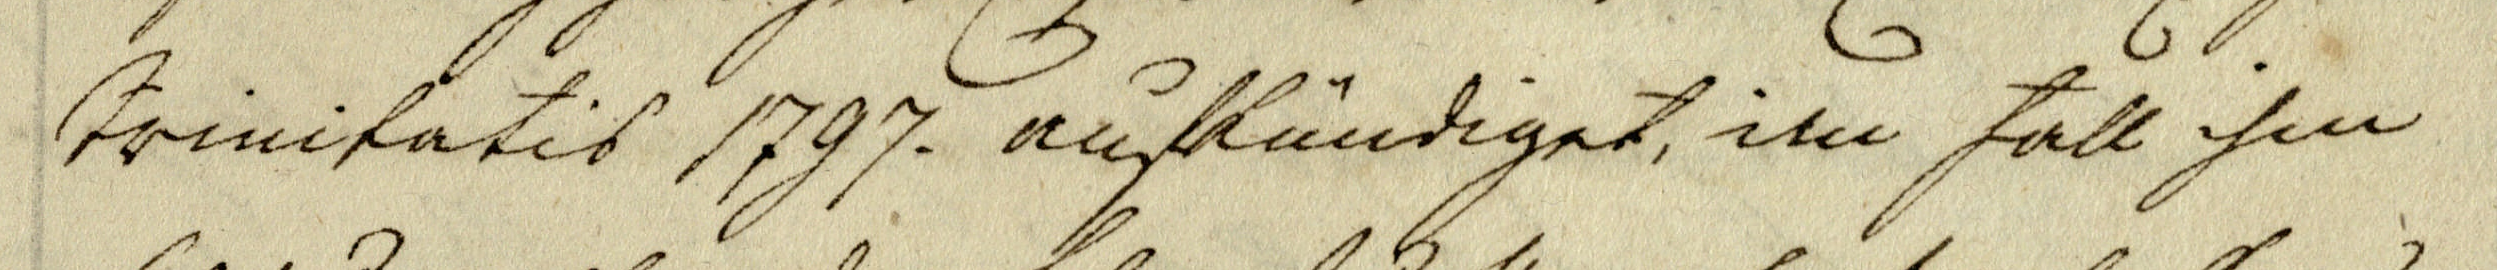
Trinitatis 1797. aufkündiget, im Fall ihm
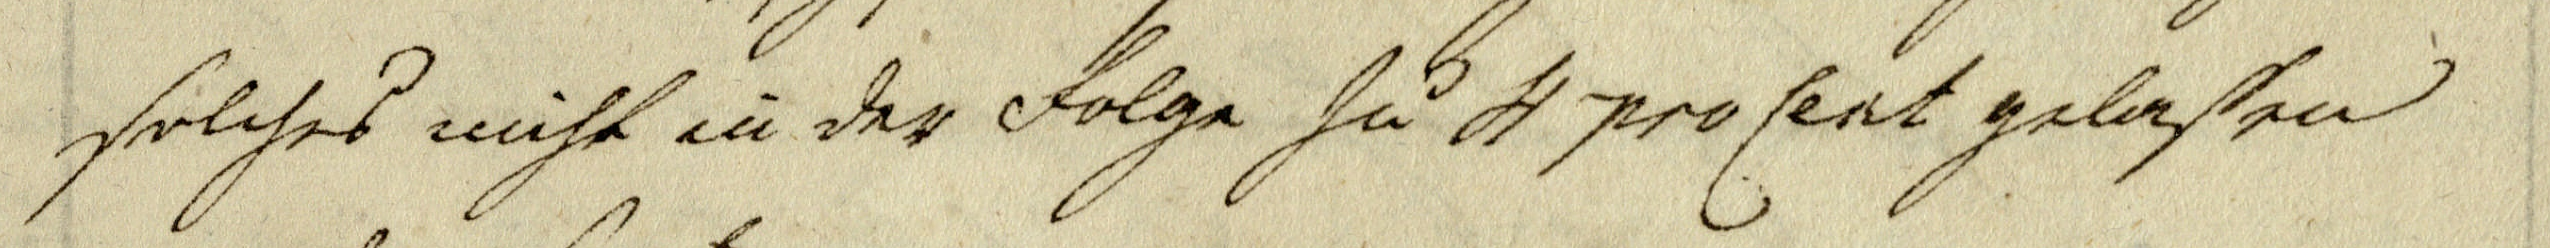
solches nicht in der Folge zu 4 pro Cent gelassen
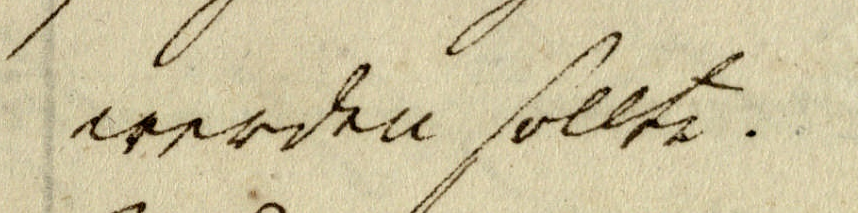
werden sollte.
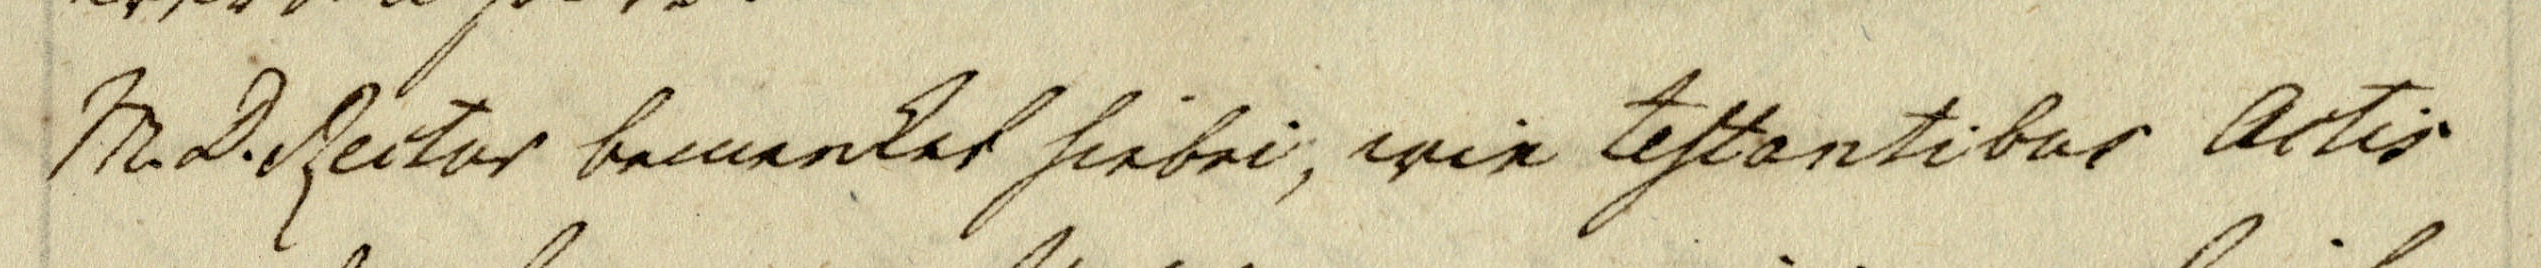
M. D. Rector bemerket hiebei, wie testantibus Actis
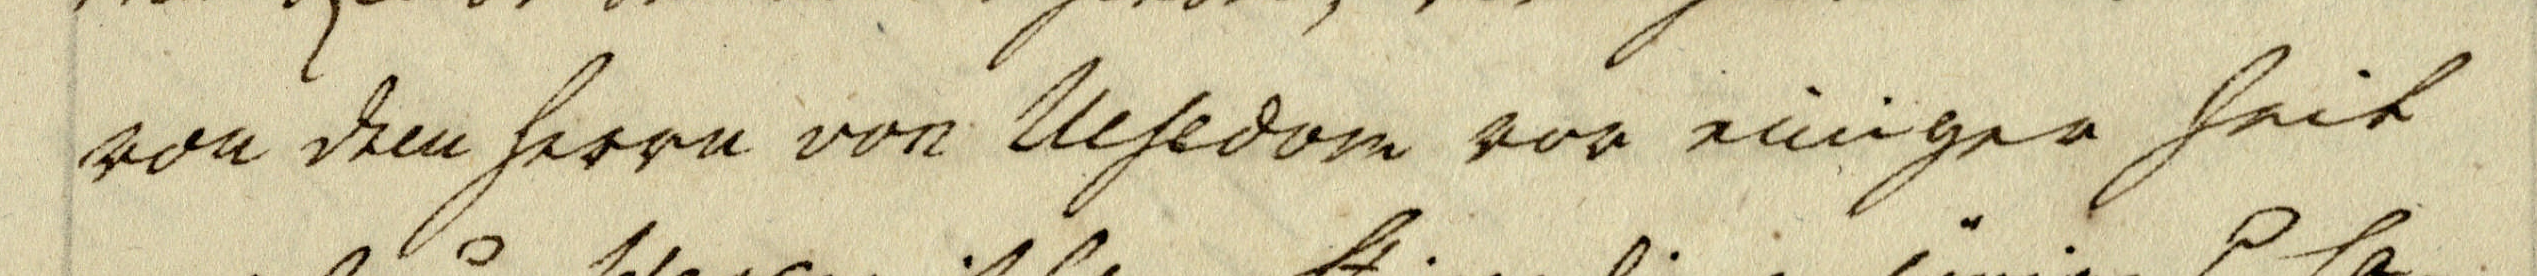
von dem Herrn von Uesedom vor einiger Zeit
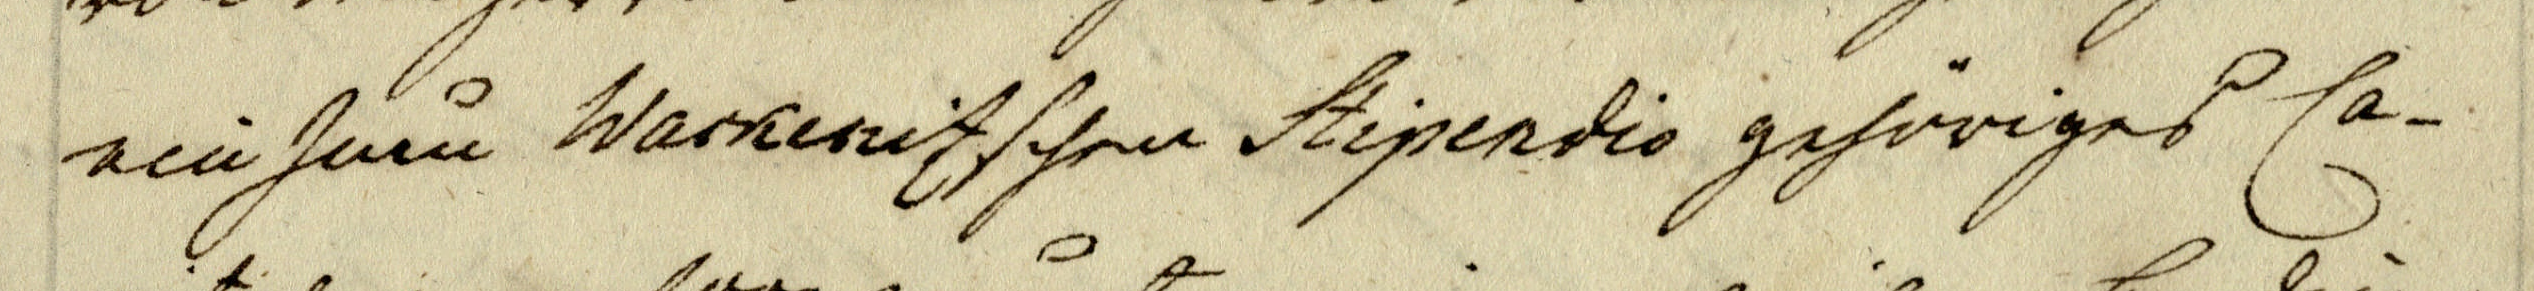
ein zum Wackenitzschen Stipendio gehöriges Ca¬
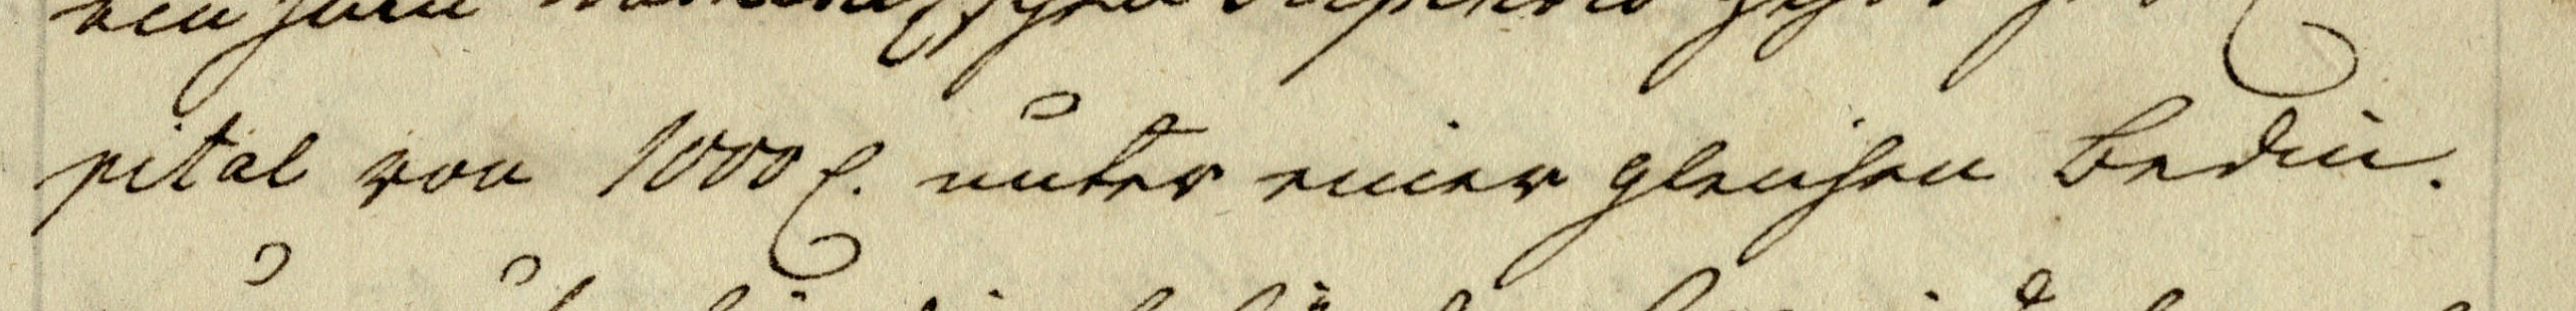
pital von 1000 l. unter einer gleichen Bedin¬
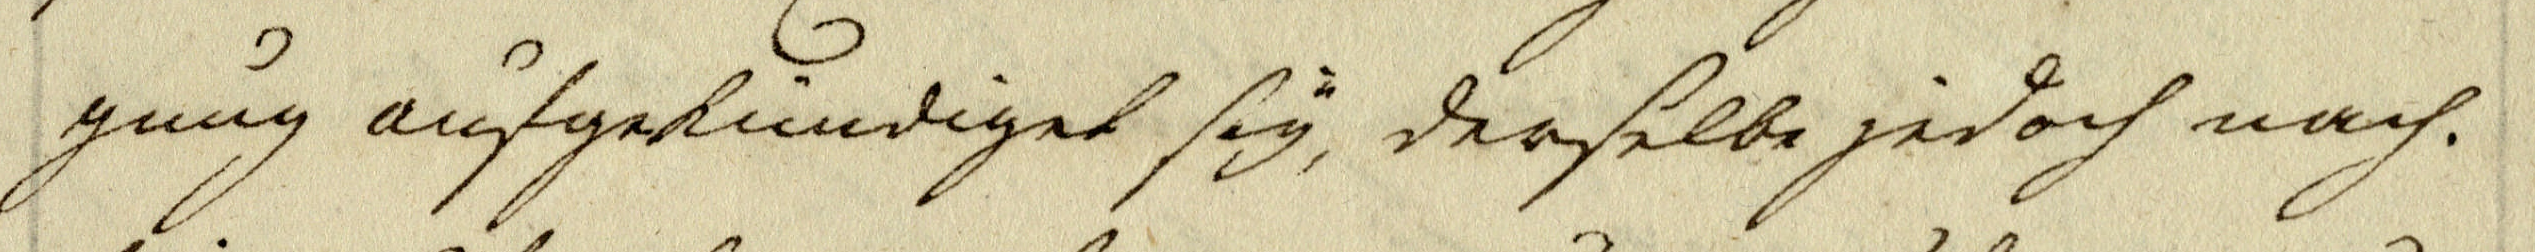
gung aufgekündiget seÿ, derselbe jedoch nach
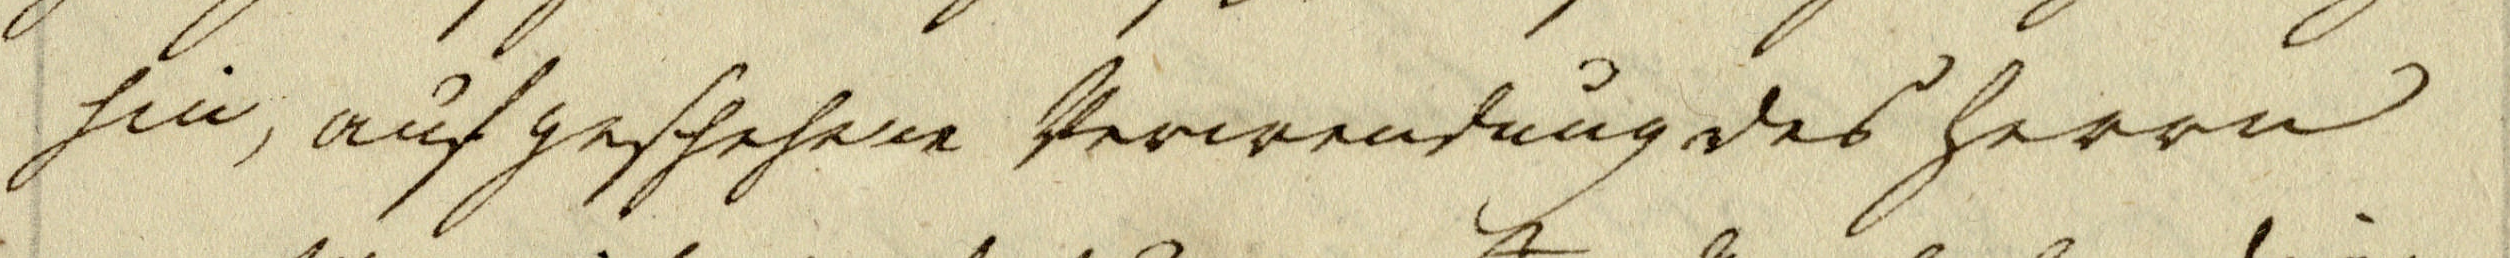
hin, auf geschehene Verwendung des Herrn
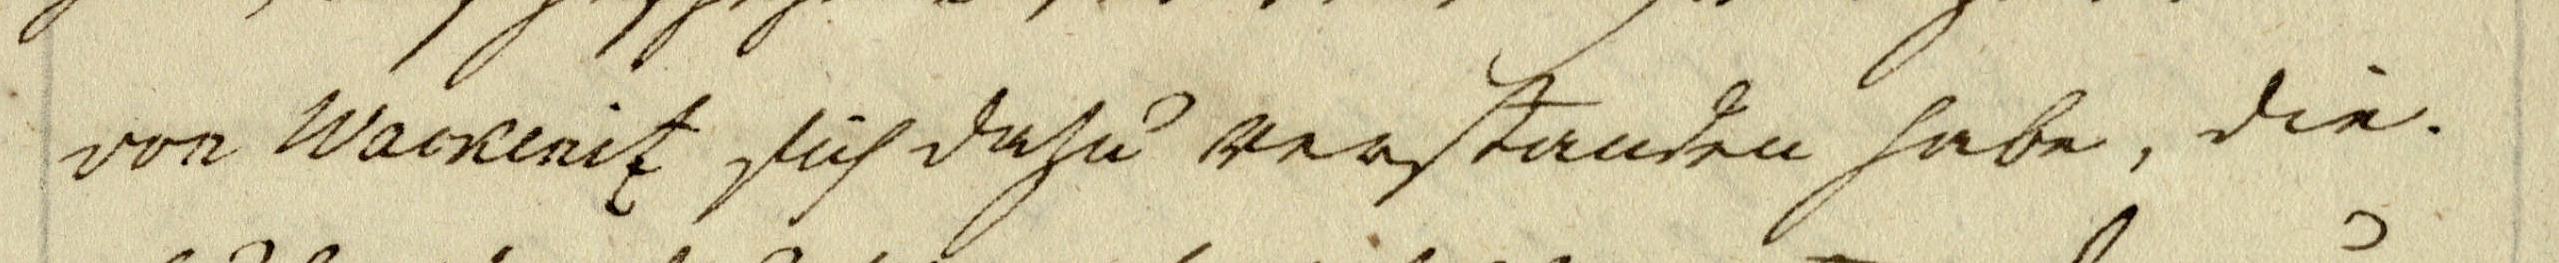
von Wackenitz sich dazu verstanden habe, die¬
